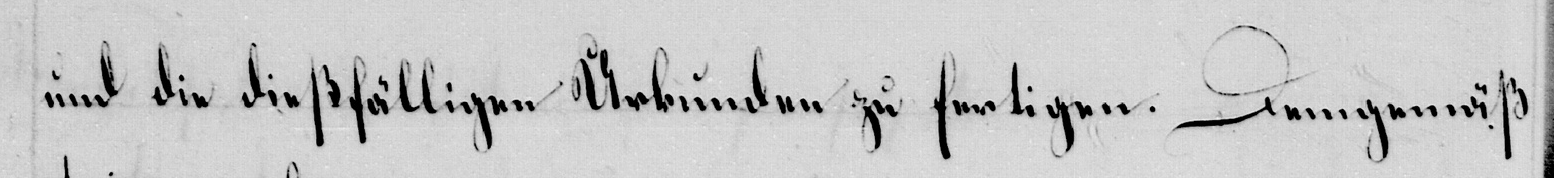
und die dießfälligen Urkunden zu fertigen. Demgemäß
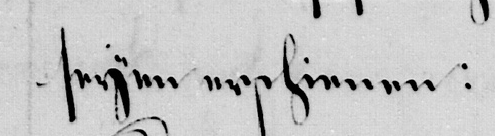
seyen erschienen:
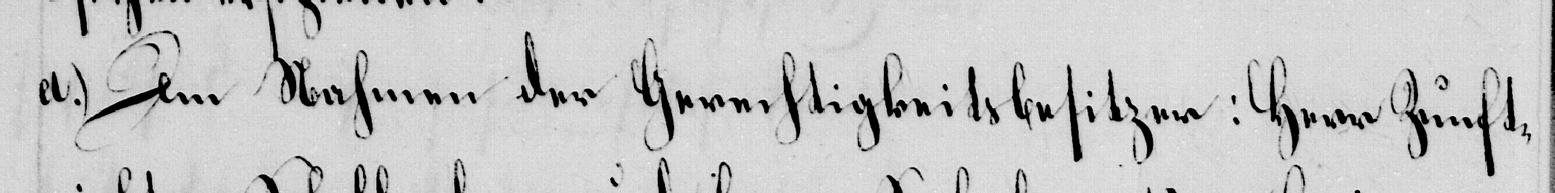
a.) Im Nahmen der Gerechtigkeitsbesitzer: Herr Zunft¬
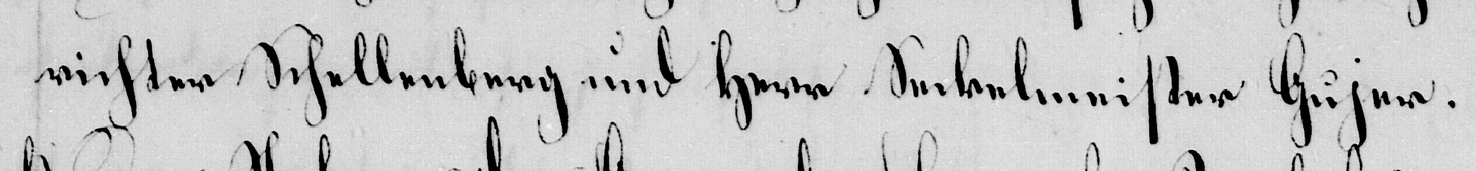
richter Schellenberg und Herrn Seckelmeister Gujer.
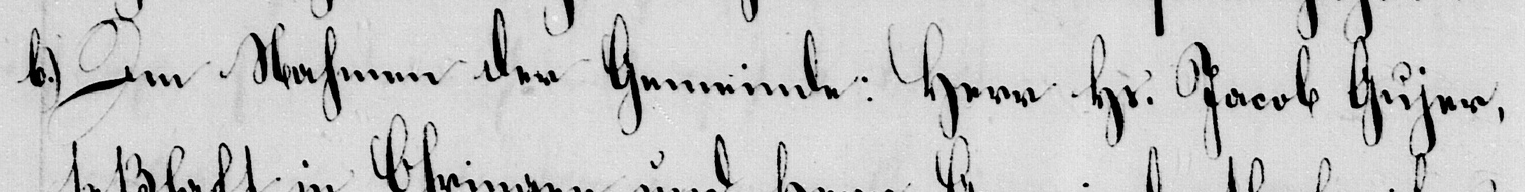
b.) Im Nahmen der Gemeinde: Herr Hs. Jacob Gujer,
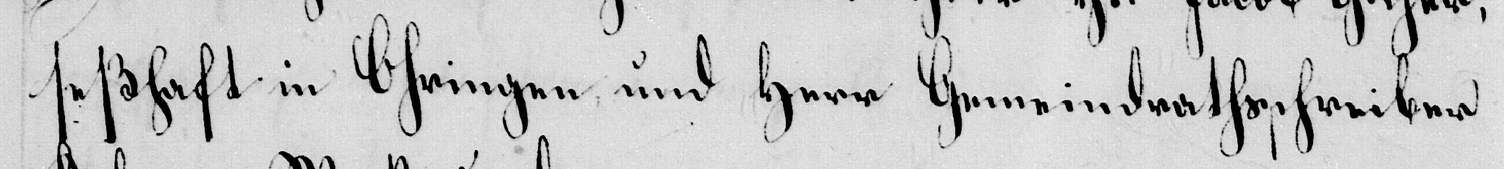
seßhaft in Ohringen und Herr Gemeindrathsschreiber
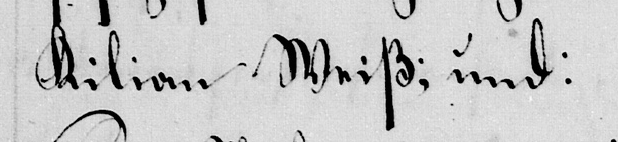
Kilian Weiß; und
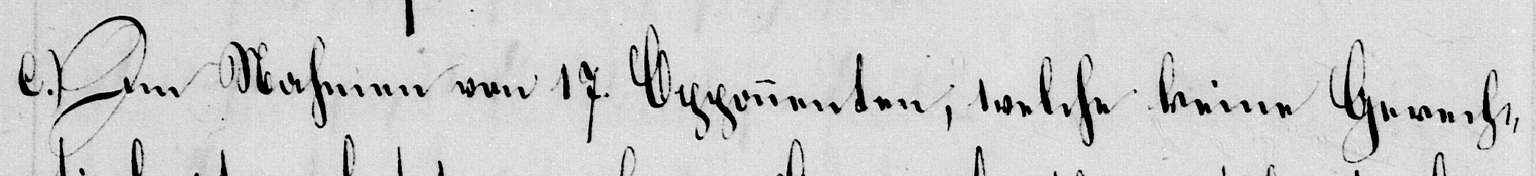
c.) Im Nahmen von 17. Opponnenten, welche keine Gerech¬
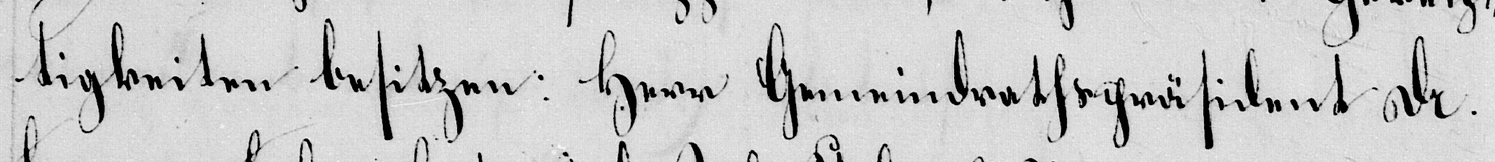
tigkeiten besitzen: Herr Gemeindrathspräsident Dr.
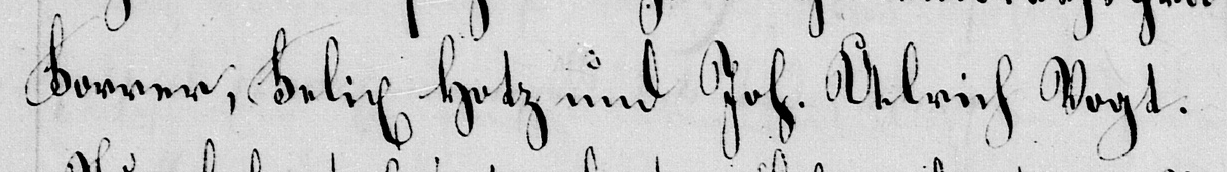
Forrer, Felix Hotz und Joh. Ulrich Vogt.
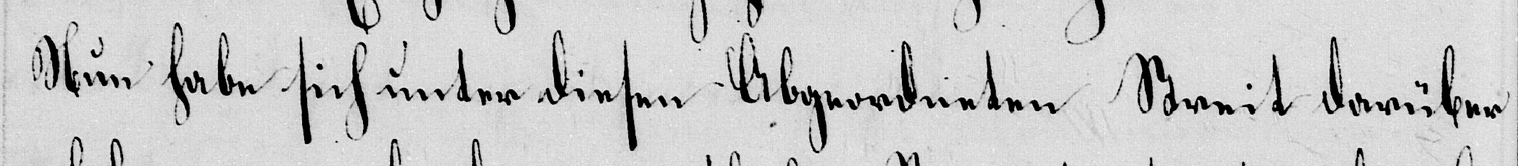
Nun habe sich unter diesen Abgeordneten Streit darüber
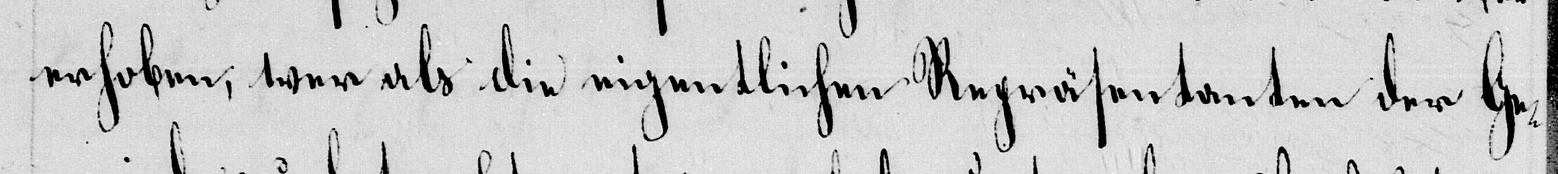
erhoben, wer als die eigentlichen Repräsentanten der Ge¬
